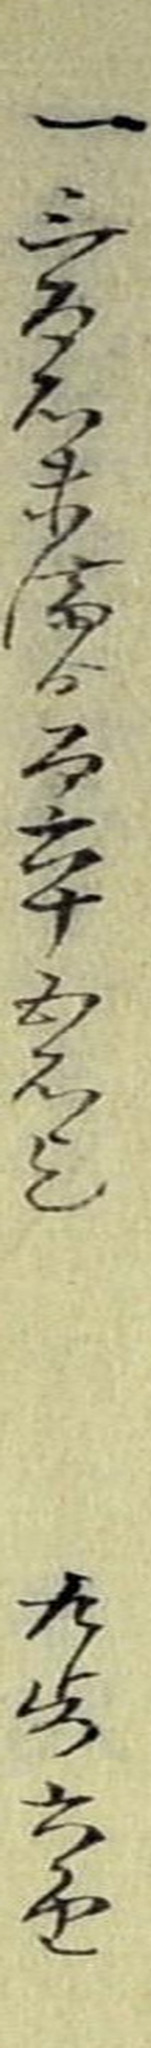一三百石未満ゟ百六十五石迄九歩六厘
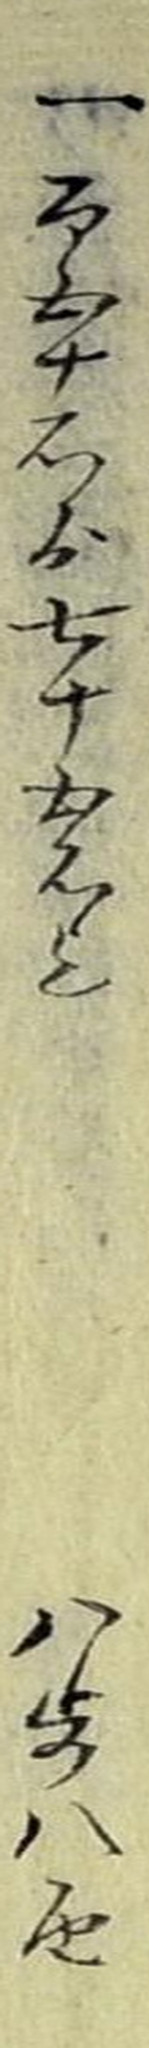一百五十石ゟ七十五石迄八歩八厘
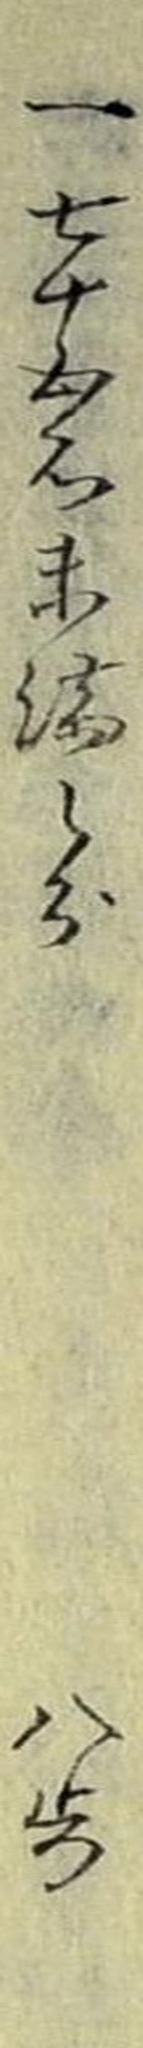一七十五石未満之分八歩
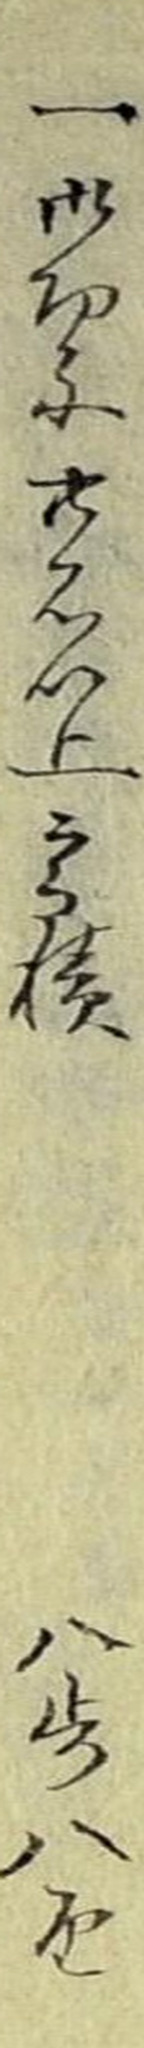一御切米廿石以上高積八歩八厘
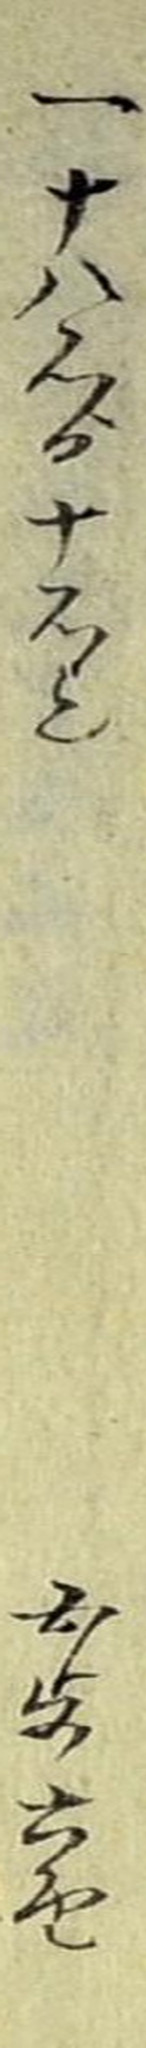一十八石ゟ十石迄五歩六厘
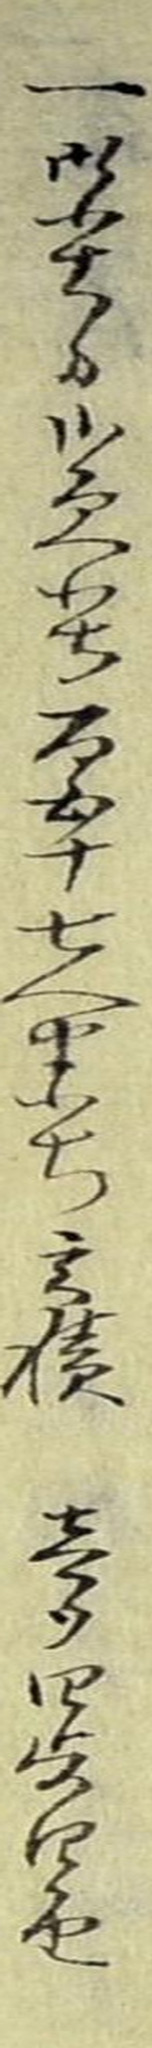一御ふち方弐百人ふち百五十七人半ふち高積壱匁四歩四厘
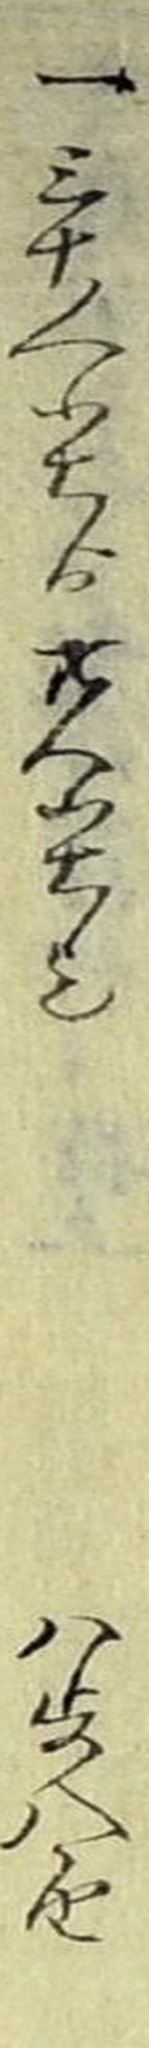一三十人ふちゟ廿人ふち迄八歩八厘
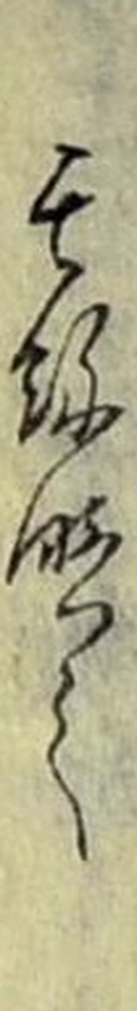其余略之

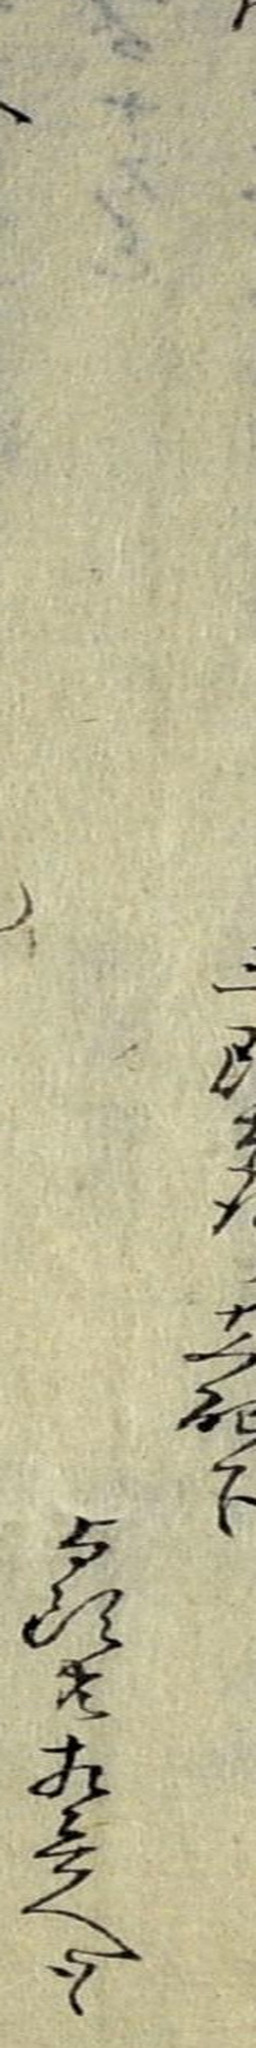与頭共拾壱人ツヽ
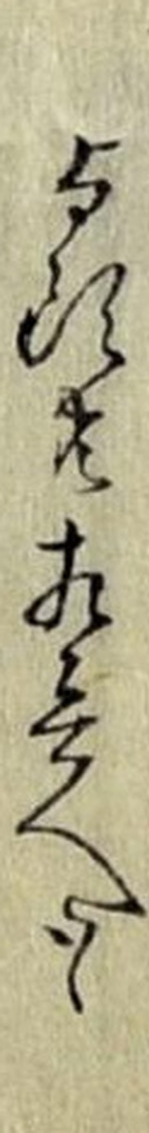与頭共拾壱人ツヽ
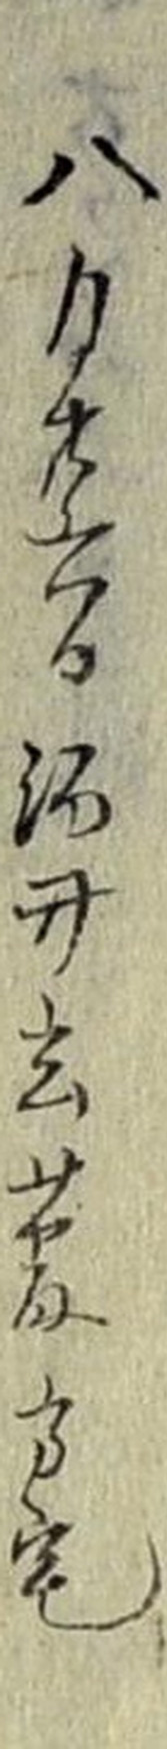八月廿六日酒井玄蕃方宅
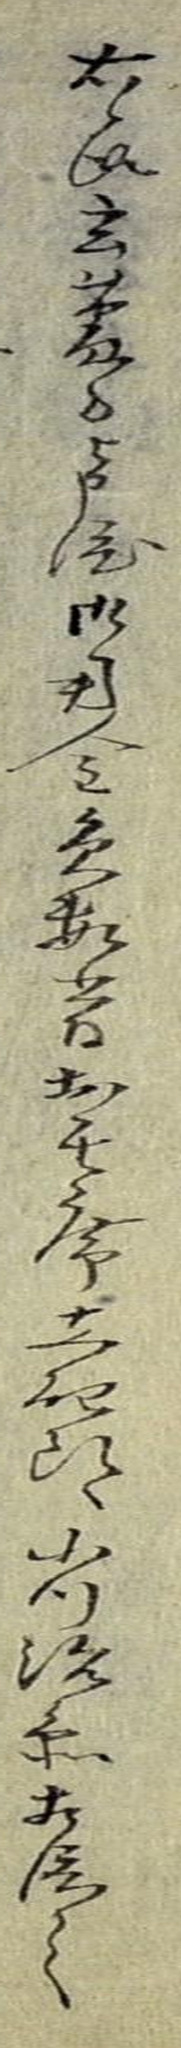右之趣玄蕃方被申渡御用金員数書付於其席支配頭へ小川治兵衛相渡之
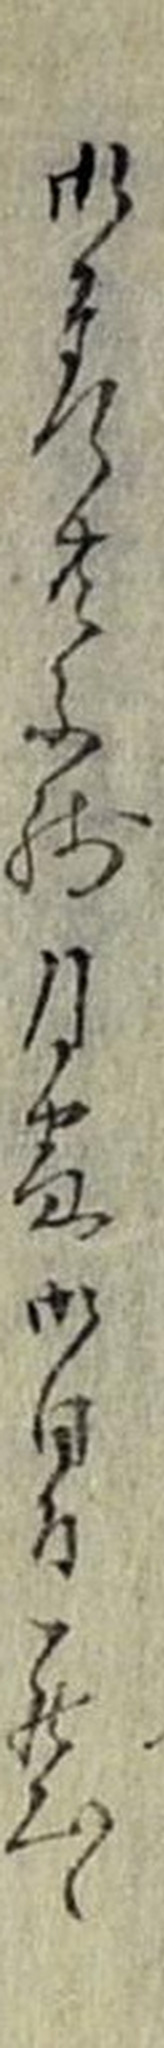御奉行共不残月番御目付罷出候
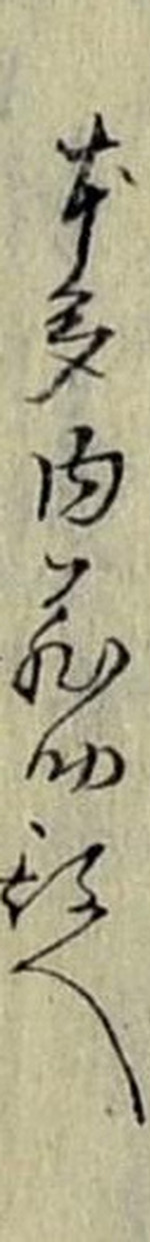本多内蔵助役人
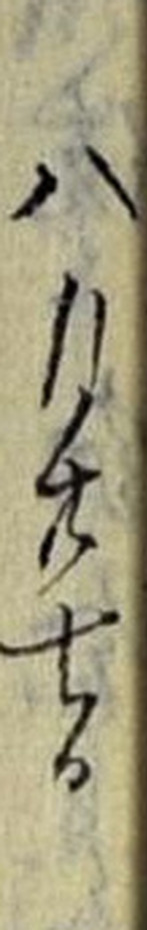八月廿七日
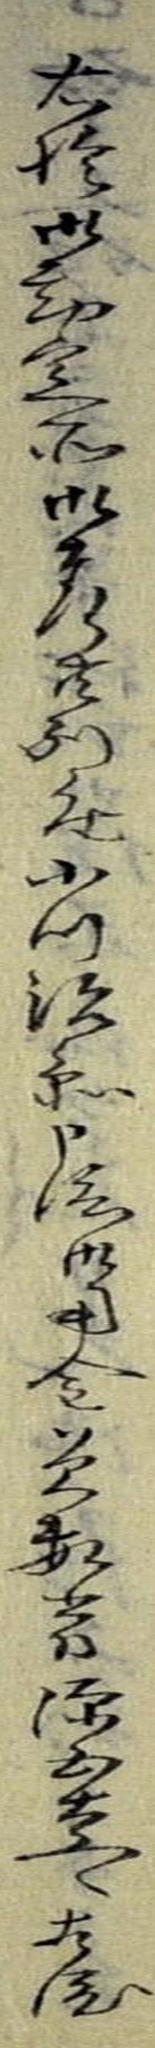右於御勘定所御奉行共列座小川治兵衛申渡御用金員数書付源五大夫へ相渡
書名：命令之部 一
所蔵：福井県文書館 Fukui Prefectural Archives
